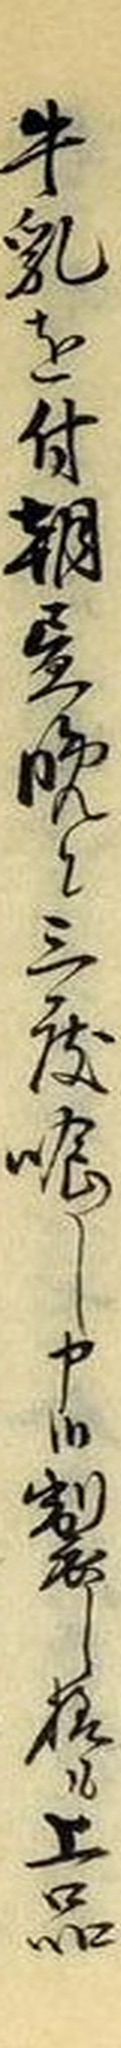牛乳を付朝昼晩と三度喰し申候製し様も上品
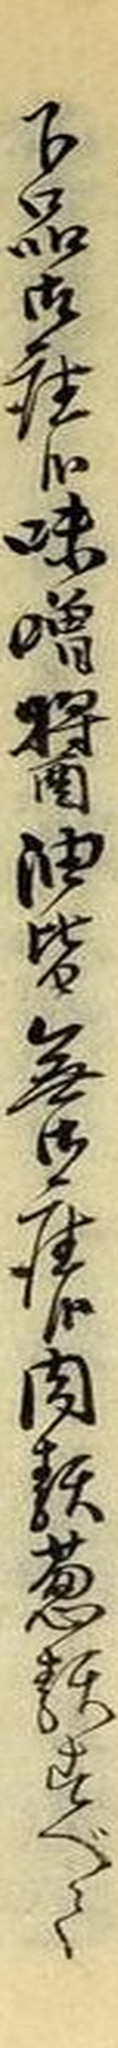下品御座候味噌醤油皆無御座候肉類葱類すべて
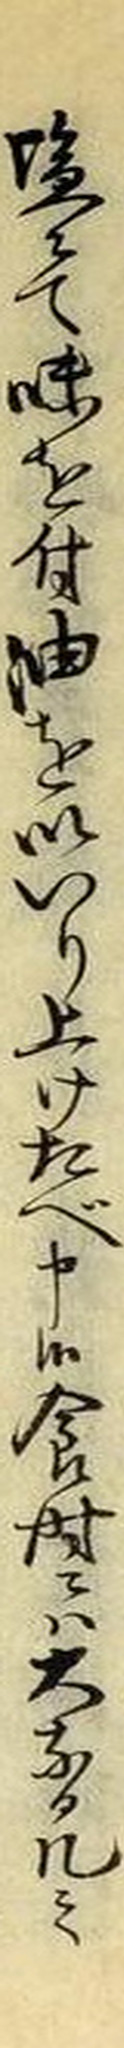塩ニ而味を付油を以いり上けたべ申候食時二ハ大なる几之
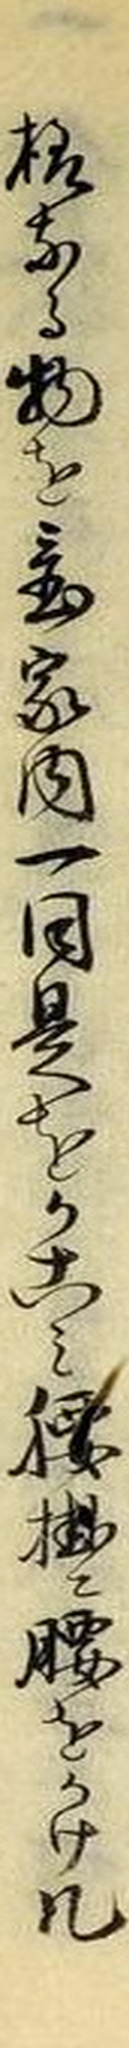様なる物を置家内一同是をかこミ腰掛ニ腰をかけ几
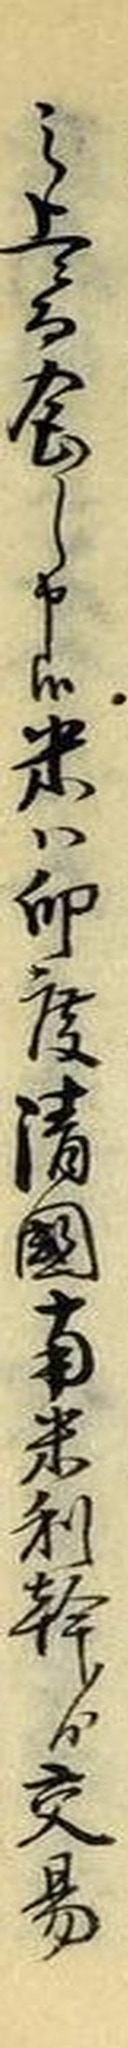之上二而食し申候米ハ印度清国南米利幹ゟ交易
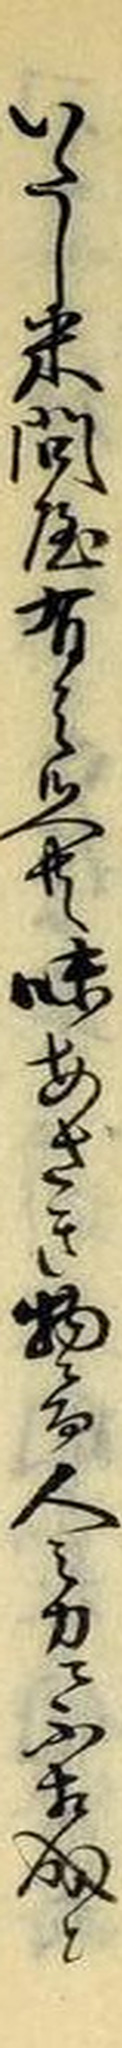いたし米問屋有之候へ共味あさき物ニ而人之力に不相成と
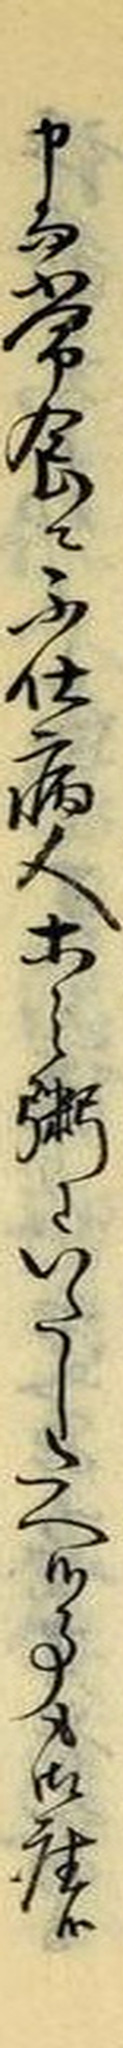申而常食に不仕病人等之粥にいたしたへ候事も御座候
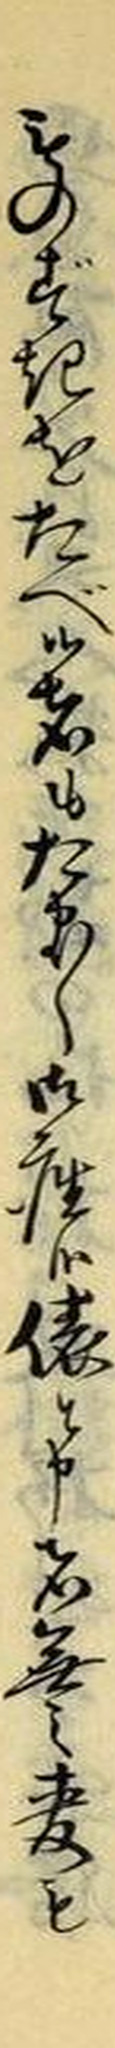ものずきをたべ候者もたま〳〵御座候俵と申者無之麦も
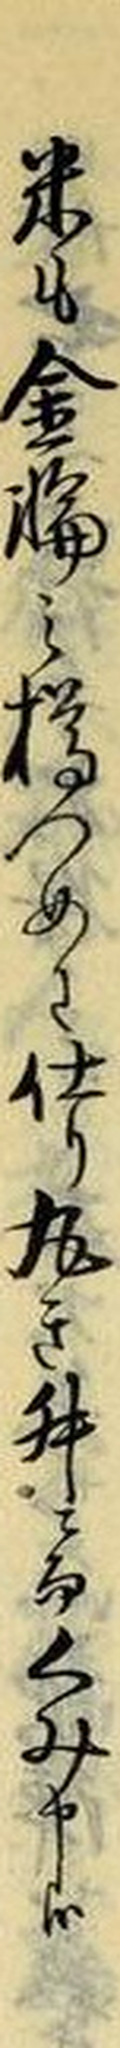米も金輪之樽つめに仕り丸き升ニ而くみ申候
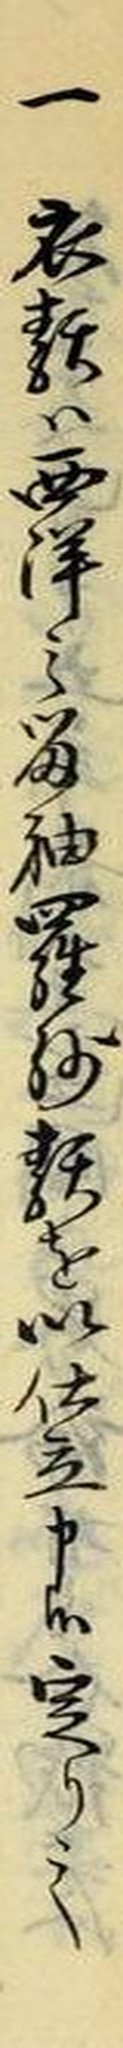衣類ハ西洋之留袖羅紗類を以仕立申候定り之
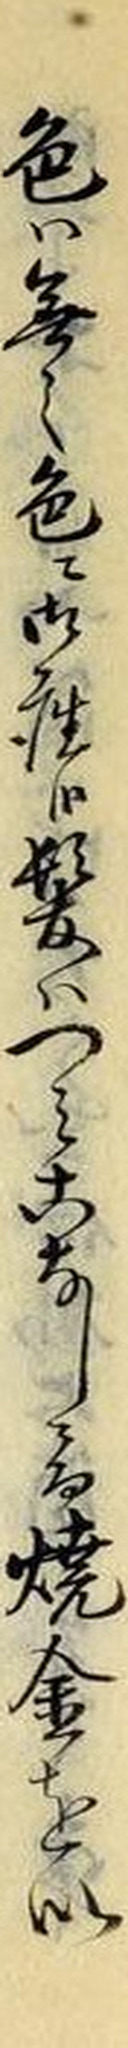色ハ無之色ニ御座候髪ハつミこなしニ而焼金を以
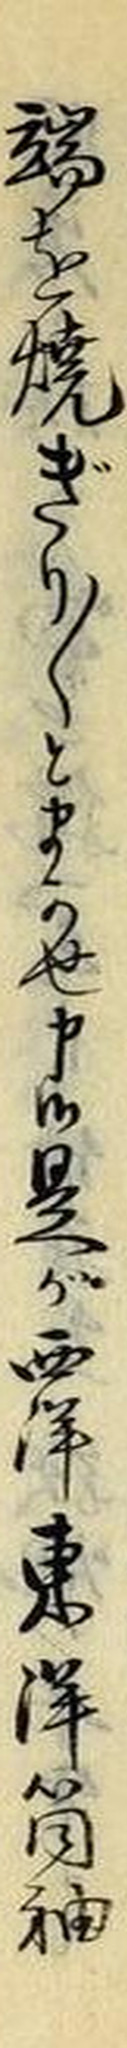橋端を焼ぎり〳〵とまかせ申候是が西洋東洋筒袖
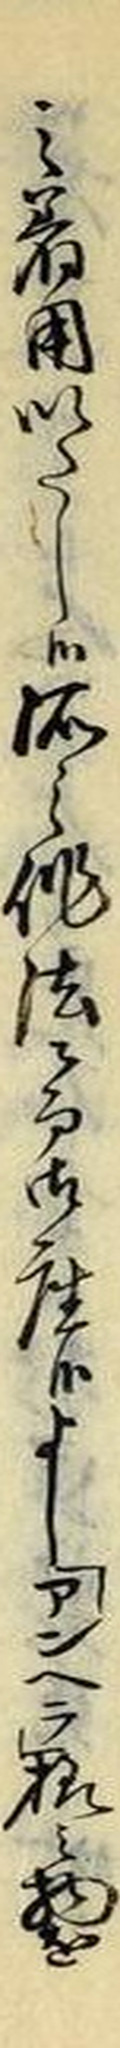の着用いたし候所之作法ニ而御座候よし「アンへラ」様之物を
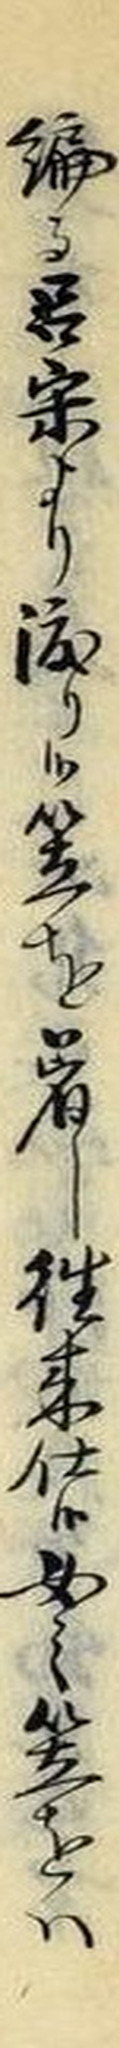編る呂宋より渡り候笠を着し往来仕候女之笠をハ
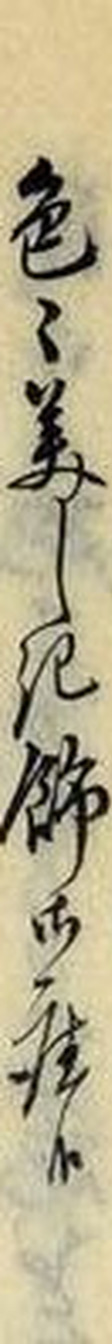色々美しき飾御座候
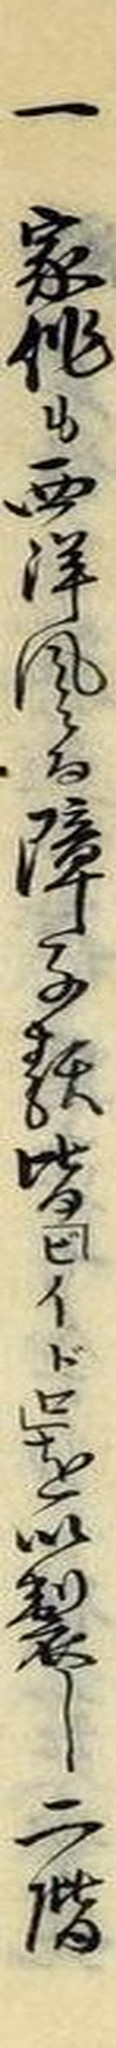一家作も西洋風ニ而障子類皆「ビイドロ」を以製し二階
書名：漂客談奇（備考雑録写8）
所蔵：福井県文書館 Fukui Prefectural Archives
